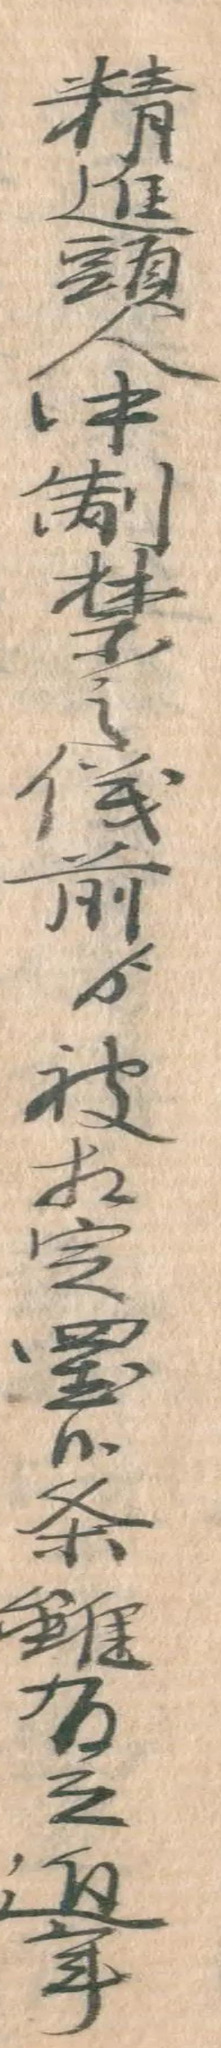一精進頭人中制禁之儀前ゟ被相定置候条雖有之近年
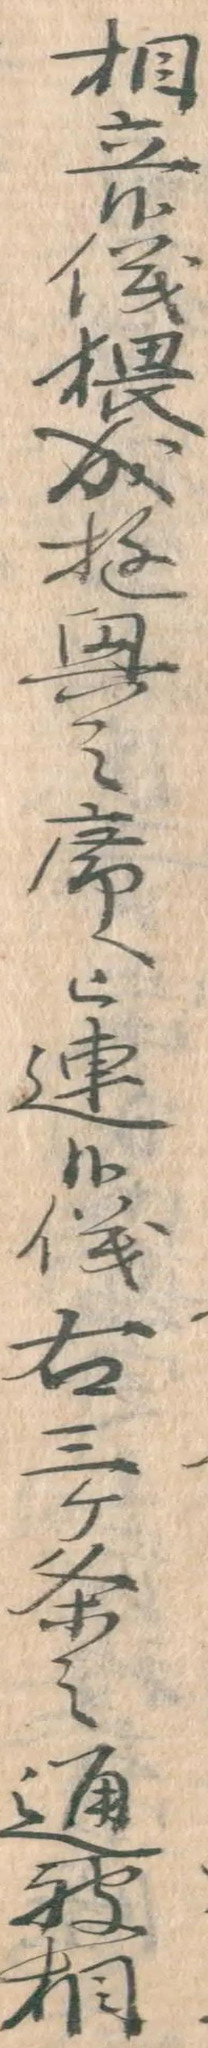相立候儀猥成遊興之席へ被連候儀右三ケ条之通被相
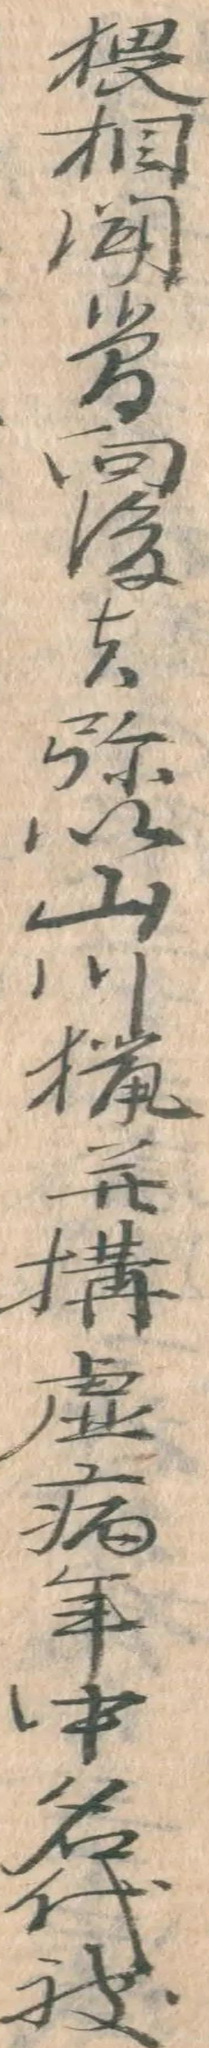猥相聞候間向後は弥以山川猟并構虚病年中名代被
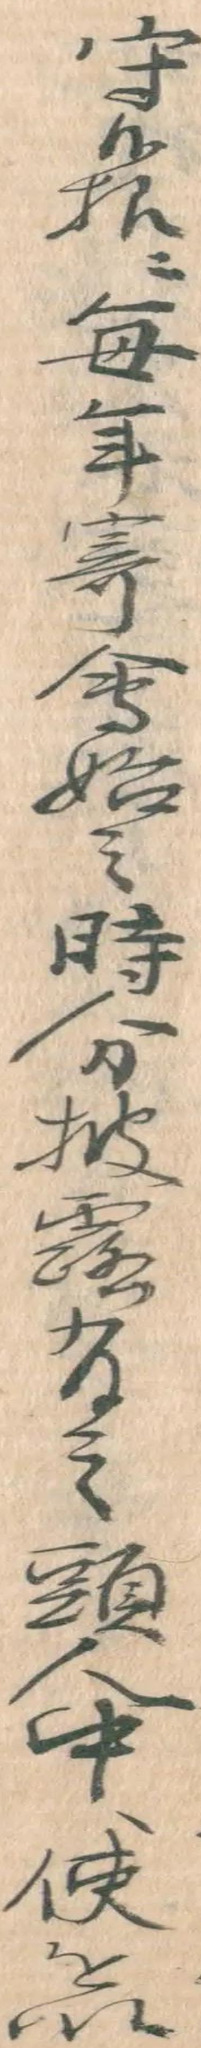守候様二毎年寄會始之時分披露有之頭人中へ使を以

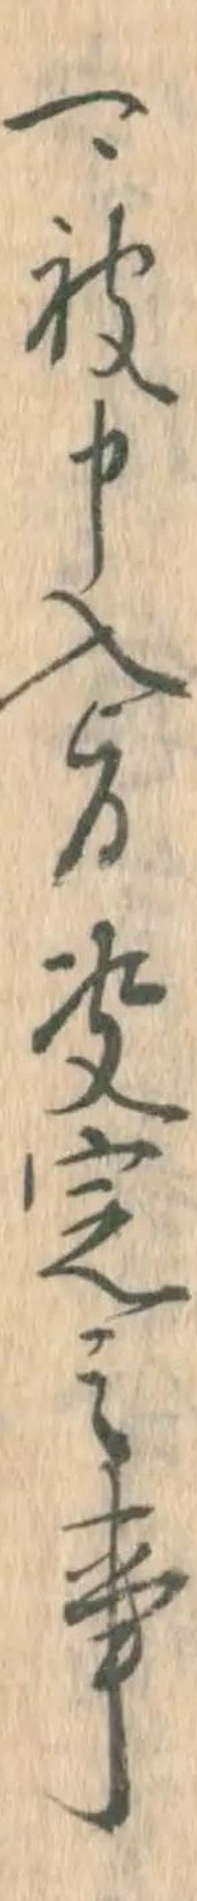可被申入旨決定之事
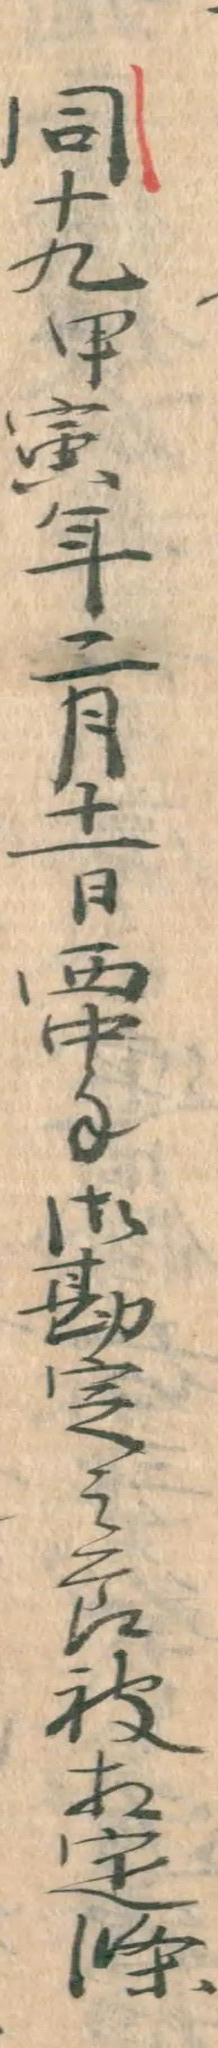同十九甲寅年二月十一日西中手御勘定之節被相定條
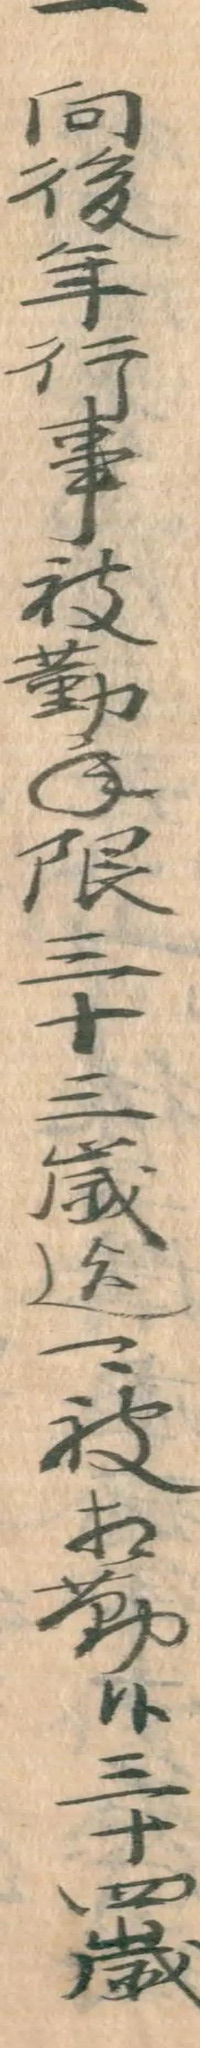一向後年行事被勤年限三十三歳迄可被相勤候三十四歳
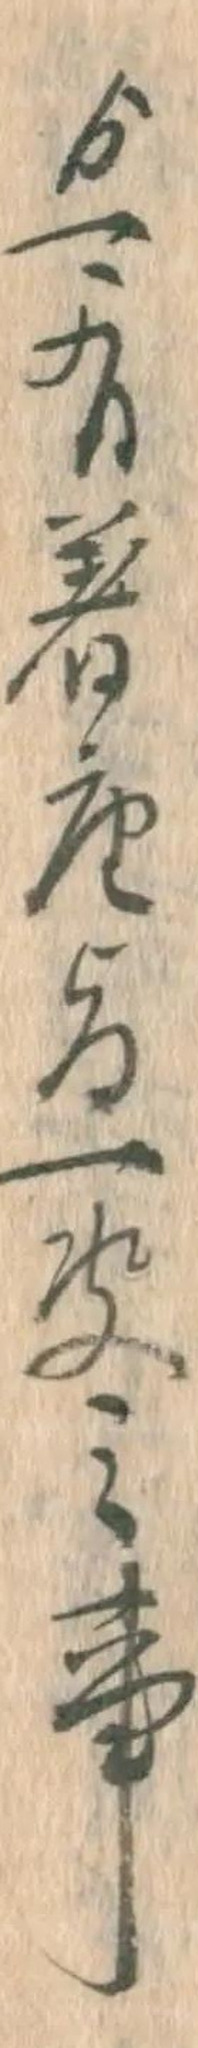ゟ可有着座旨一決之事
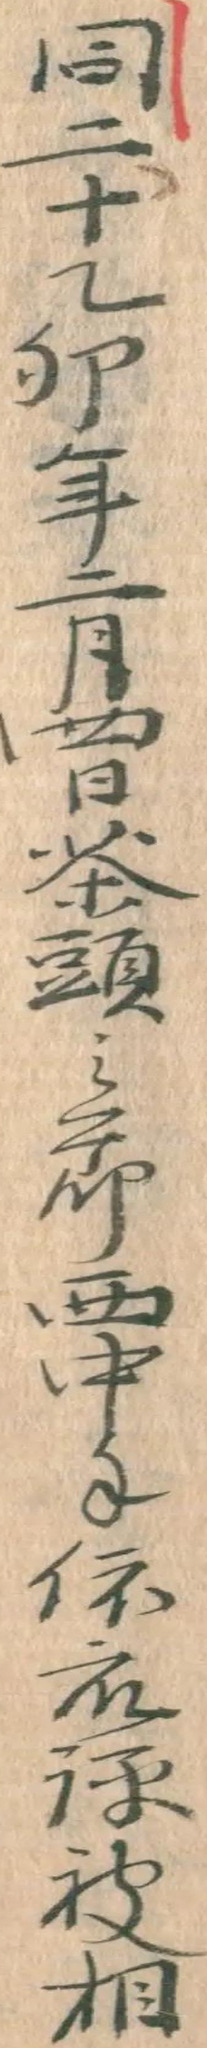同二十乙卯年二月四日荼頭之節西中手依衆評被相
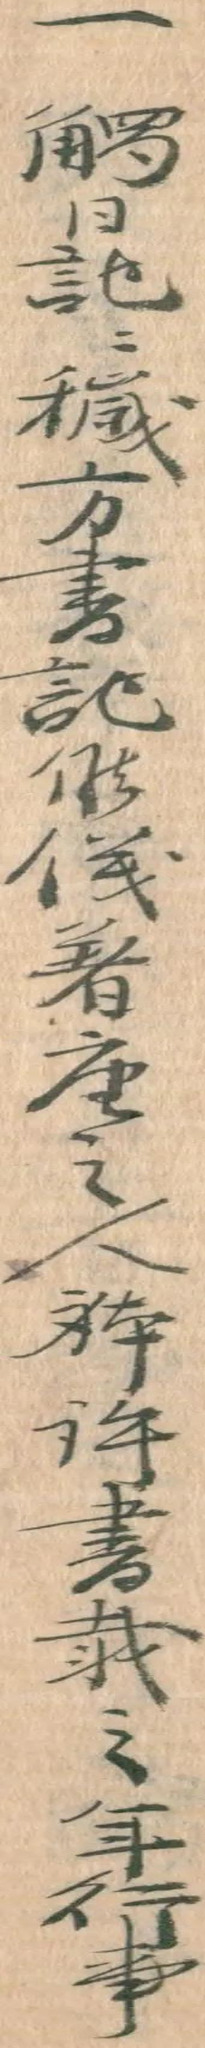一觸日記に穢方書記候儀着座之人躰許書載之年行事
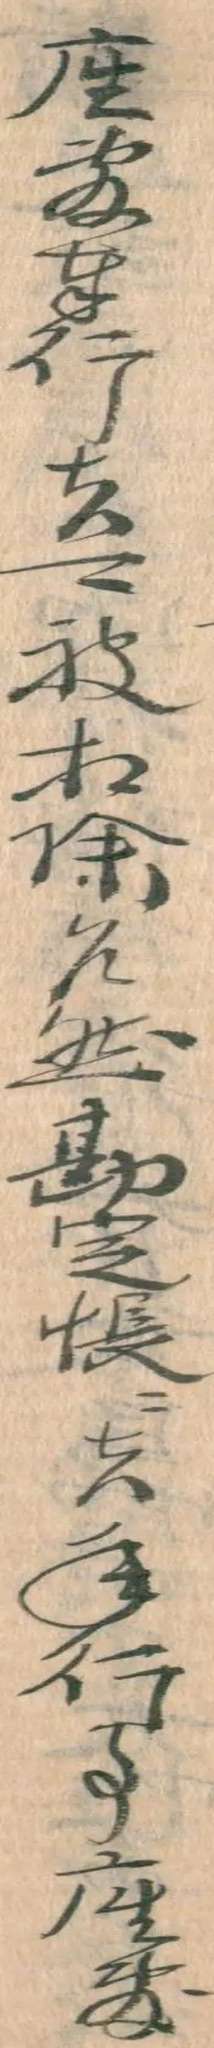座敷奉行は可被相除乍然勘定帳ニは年行事座敷
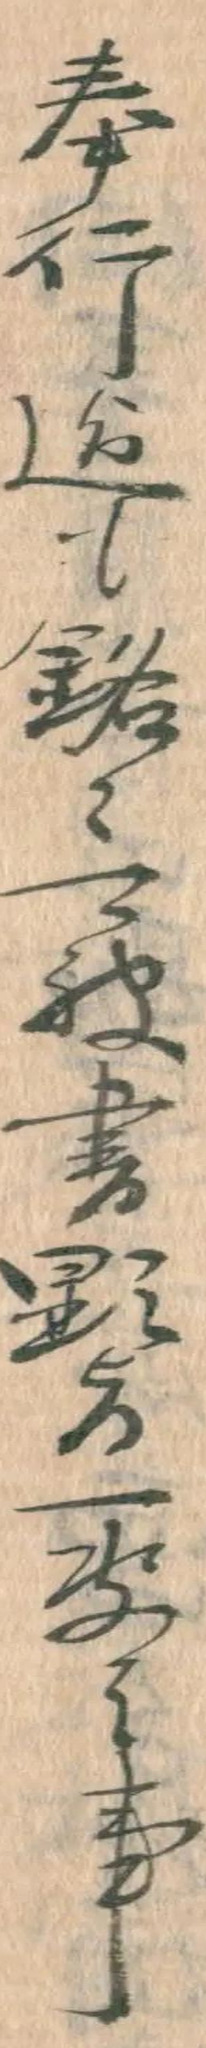奉行迄も銘々可被書顕旨一決之事
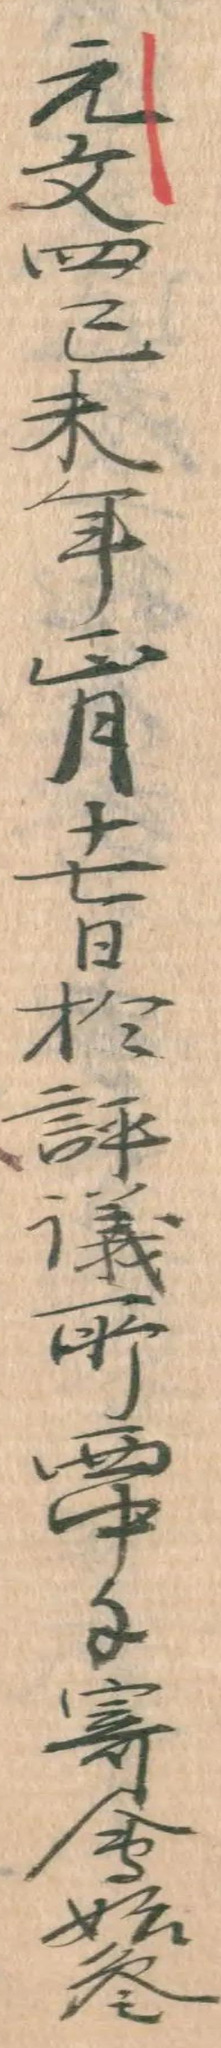元文四己未年正月十七日於評議所西中手寄會始参
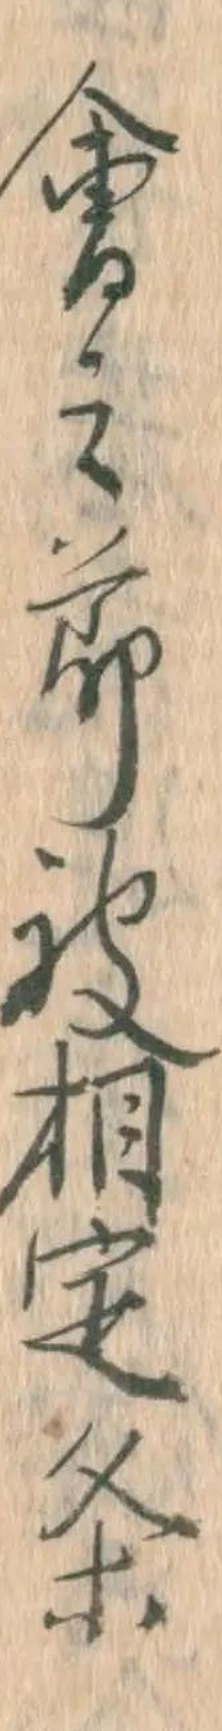會之節被相定条
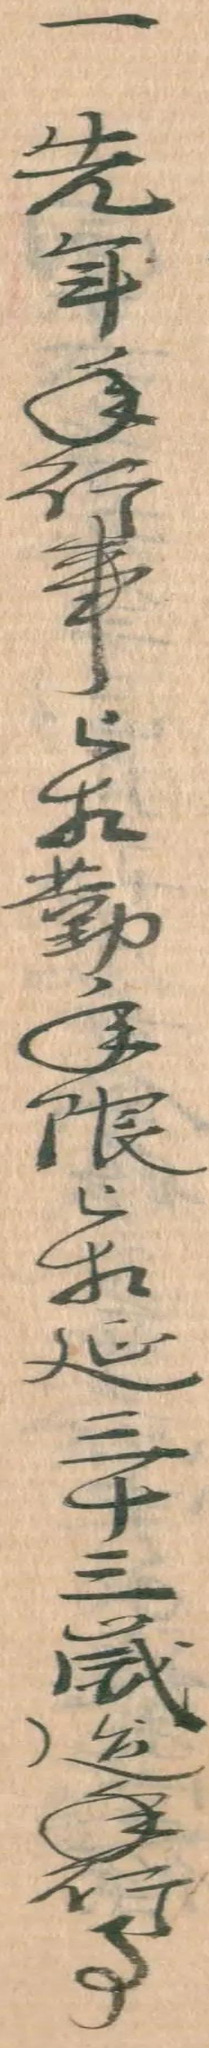一先年年行事被相勤年限被相延三十三歳迄年行事
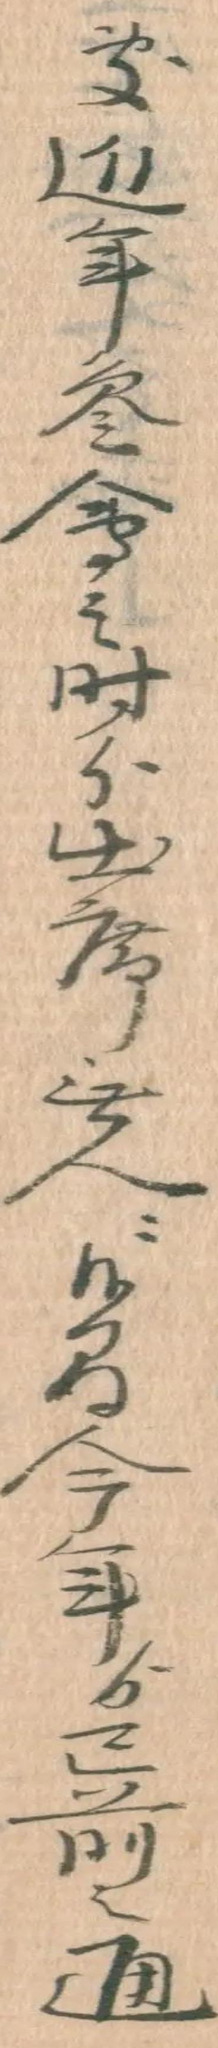處近年参會之時分出席無人に候間今年ゟ已前之通
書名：賀茂社記録. 第29冊
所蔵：国立国会図書館 National Diet Library, JAPAN
